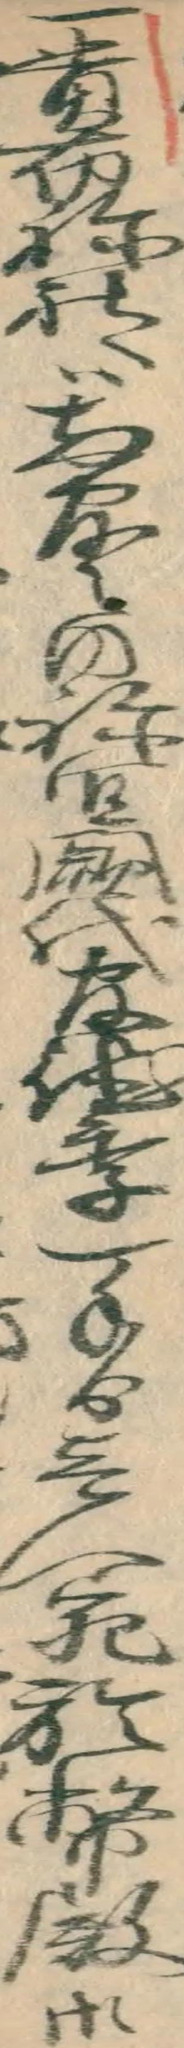一貴布祢社へハ両官之内祢宜闕代官徳季一手ゟ壱人宛於幣殿御
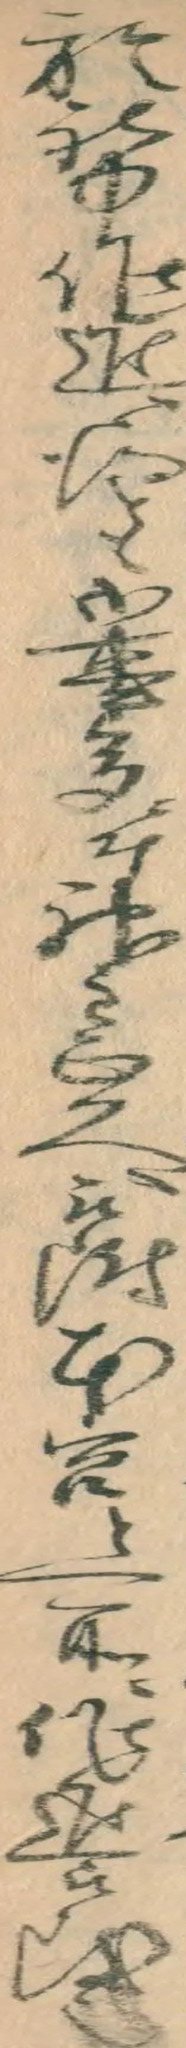於社中作進ニ候得とも御事多ニ付神主正久へ被付本宮と一所ニ作進被致候也

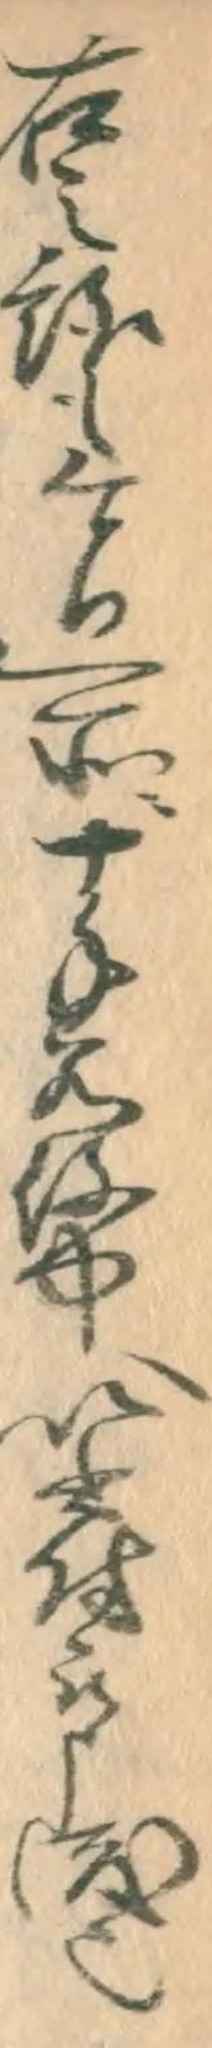右之趣も今日一所ニ十手若役中へ以書付被申渡也
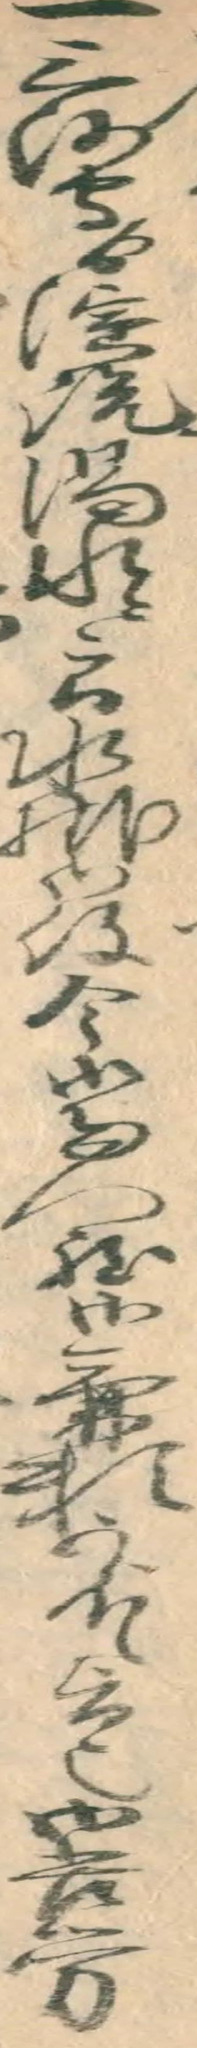一三河守ゟ演説渇水ニ候間水掛御役今御両人程御兼頼可被下候旨也御苦労
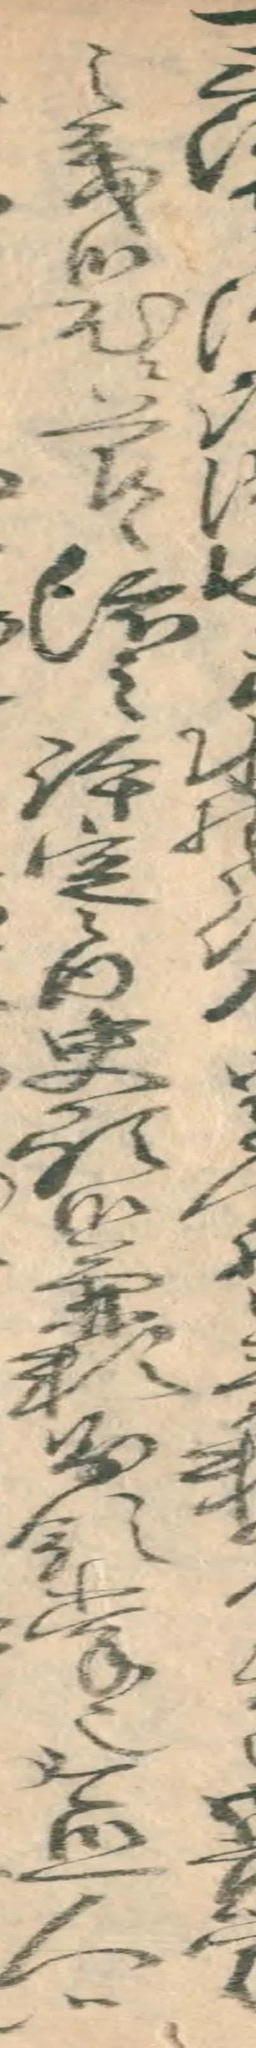之義御尤ニ思召候依之評定之内史顕御兼頼則領掌也今御一人ハ
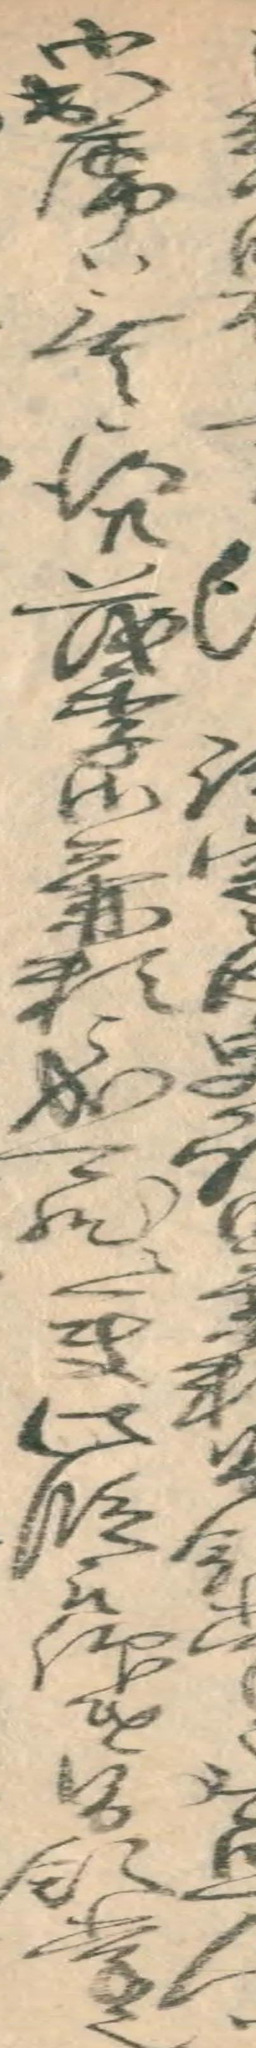御出席ハ無之候得共茂季御兼頼被成可然ニ一決此段被仰遣則領掌也
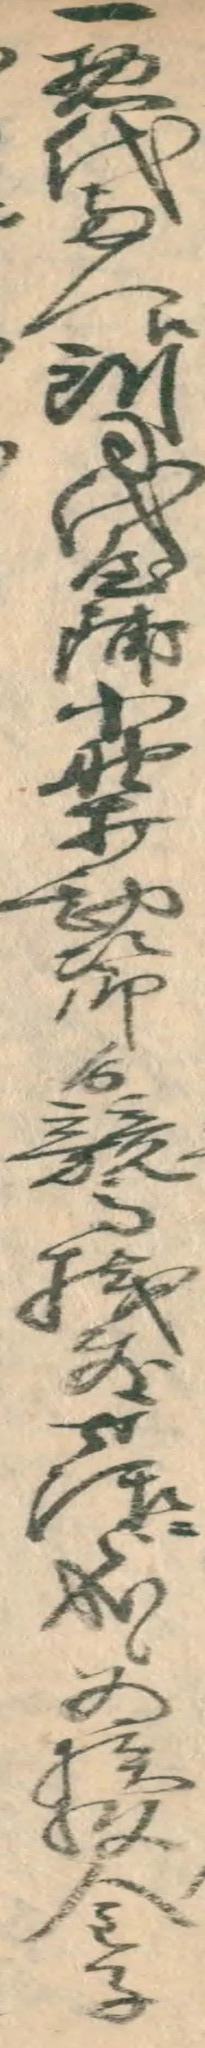一惣代両人江所司代屋鋪小野打勘次郎ゟ競馬桟敷世話ニ被成候為挨拶金子
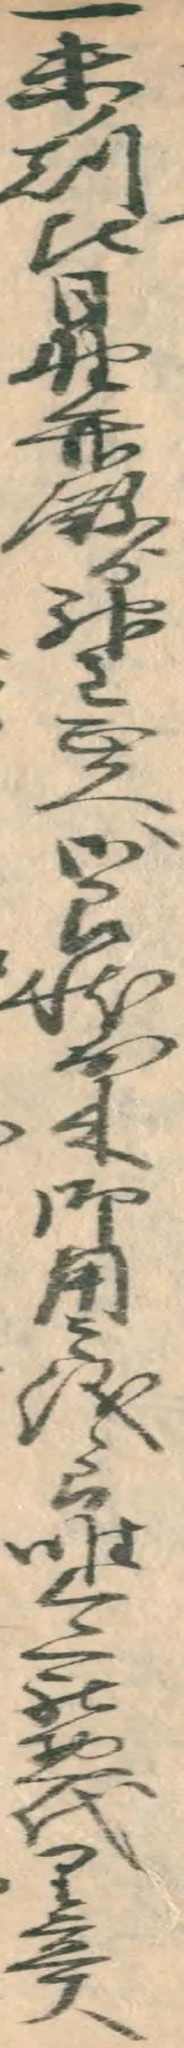一未ノ刻比日野弁殿ゟ神主正久へ御召状到来御用之儀候間唯今一社惣代里亭へ
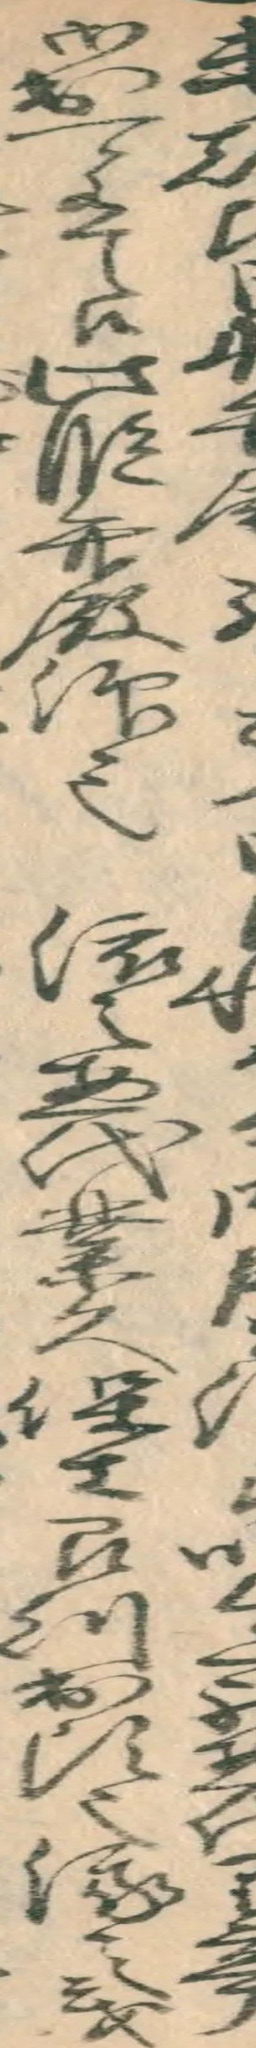御出可有之候此段弁殿仰候也依之惣代業久保土即刻出頭也俄之義
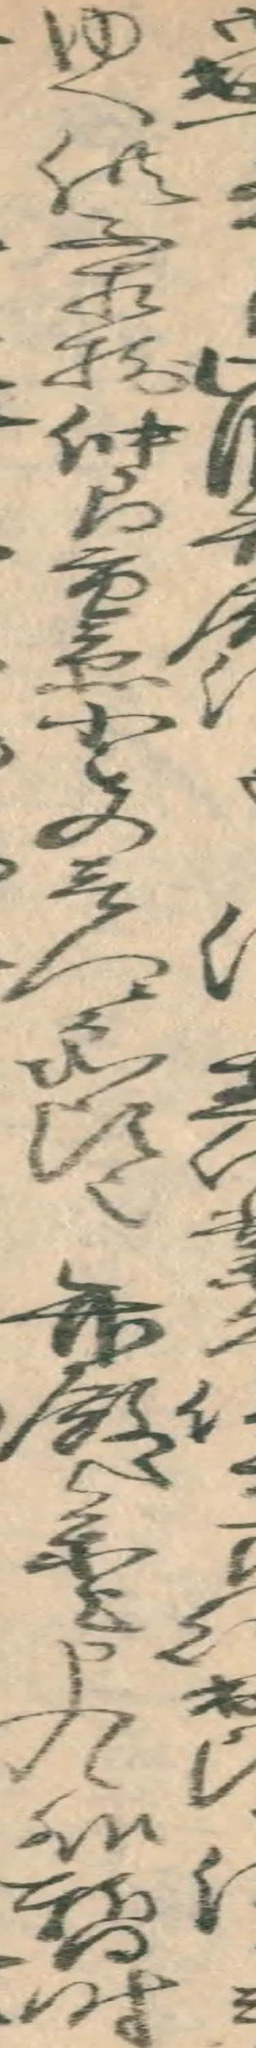ゆへ供不相揃仲間市兵衛小もの壱人ニ而出頭也弁殿へ参上申入候処暫時
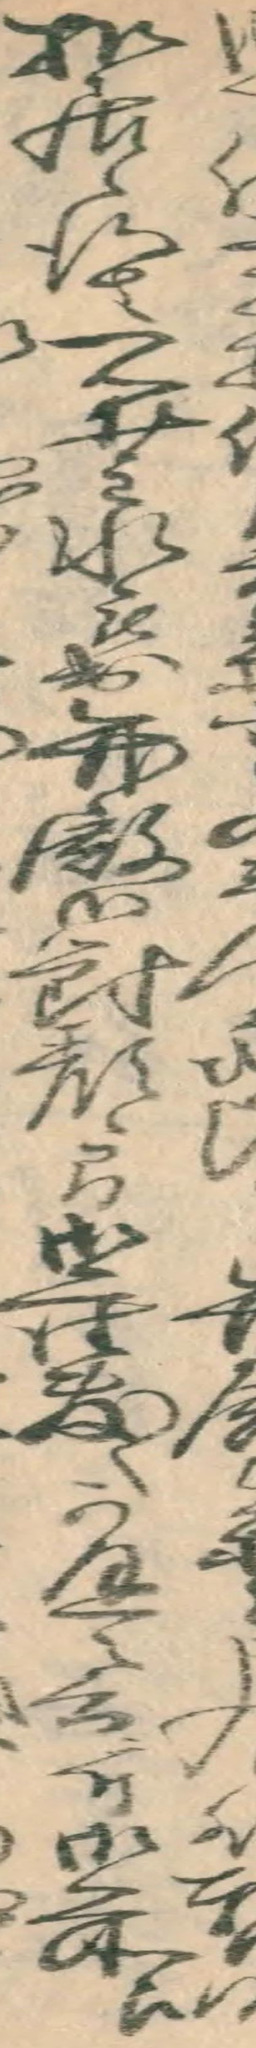扣居候得者石井主水被出弁殿御対顔候間御座敷へ可通之旨ニ付御前江
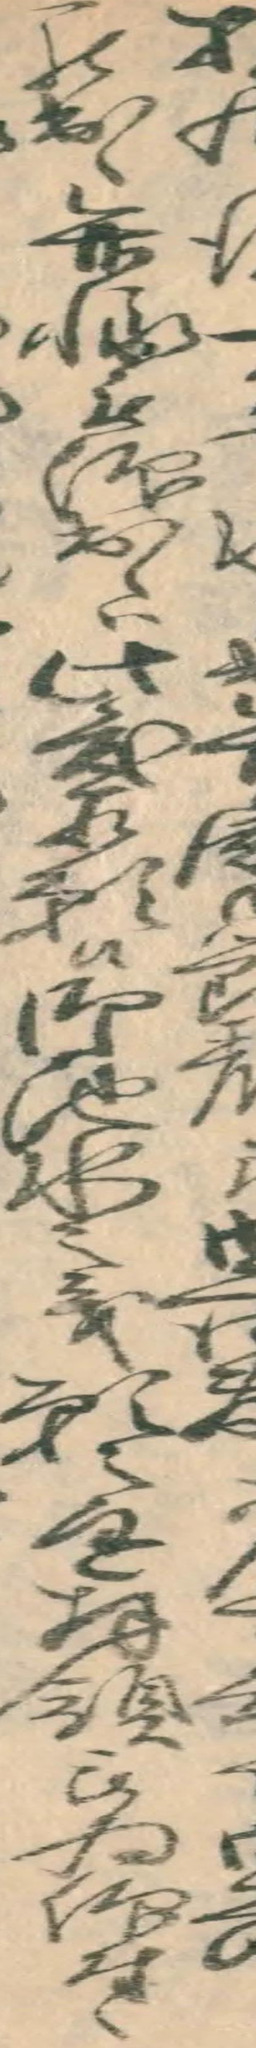罷出候弁様被仰出候ハ此度相願候於御池水之義願之通拝領被為仰付候
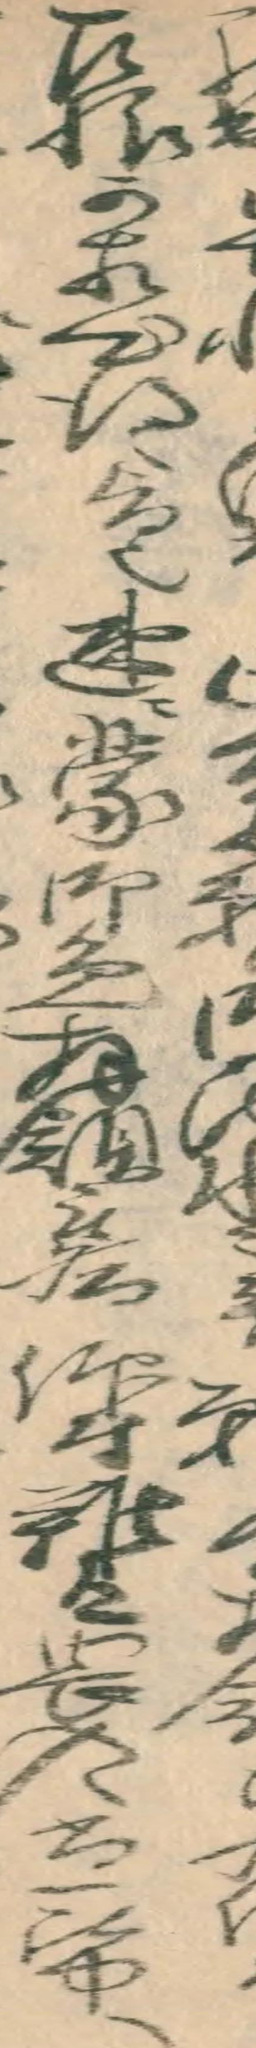左様可相心得候旨也速ニ蒙御免拝領被為仰付難有畏入候尚一社中へ
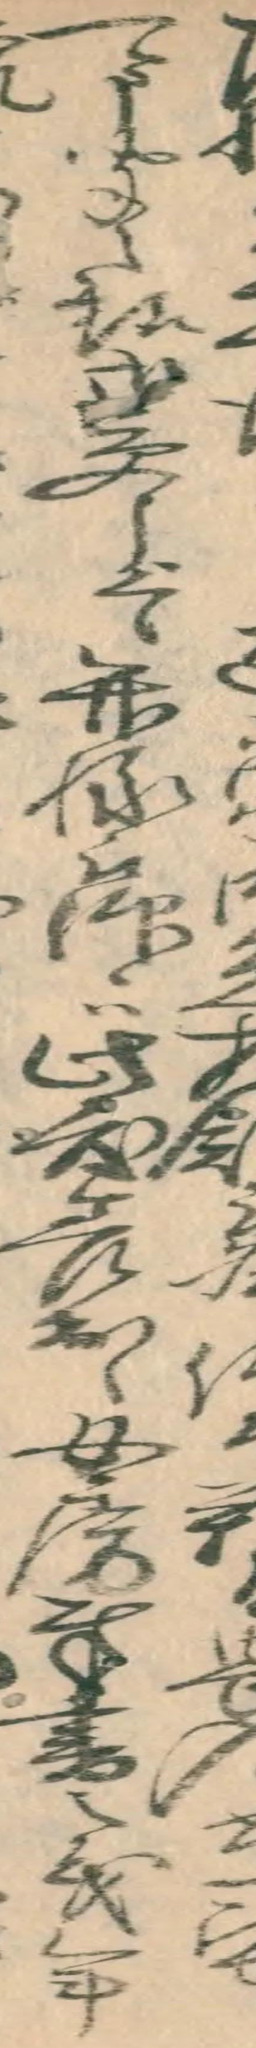可申聞候趣御受申上候弁様被仰候ハ此度差出候女房奉書之義年
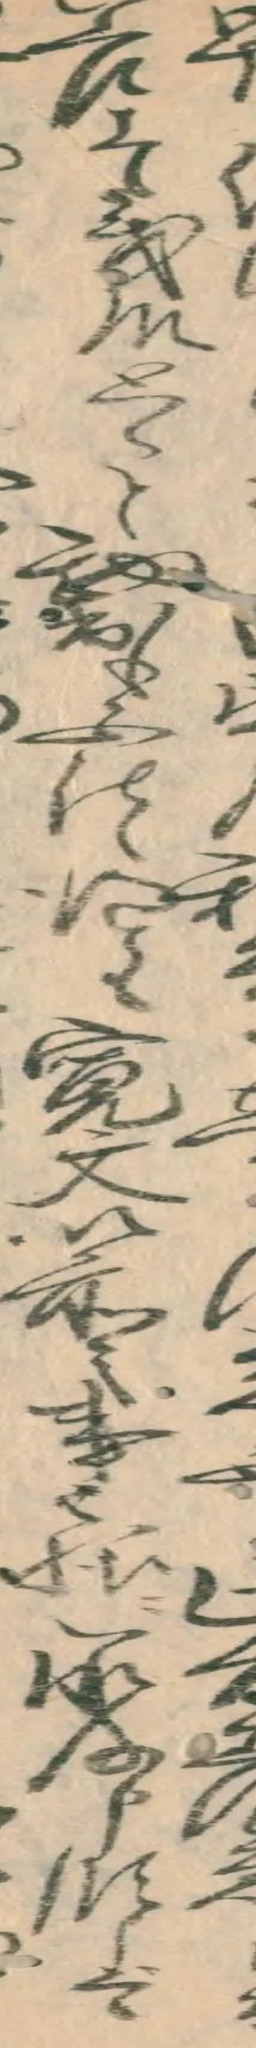差上候義故とくと勘出も不仕候得とも寛文以前之事之様ニ承及申段申上候
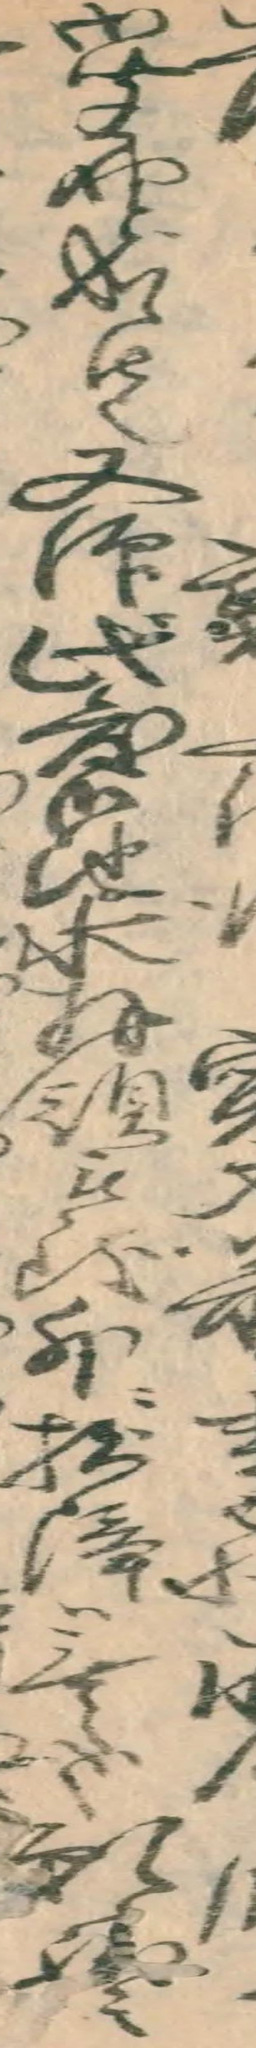御聞届被成候由也又仰ニ此度御池水拝領被致外ニ指障ハ無之哉願之
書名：賀茂社記録. 第58冊
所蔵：国立国会図書館 National Diet Library, JAPAN
